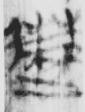速
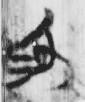爲
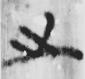之
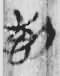○（斷）
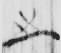之
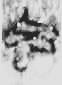命
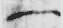一
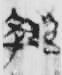執
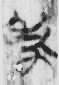事
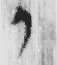人
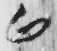㠯（以）
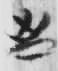至（致）
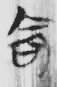命
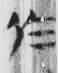於
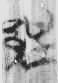郢
